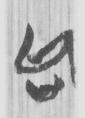句
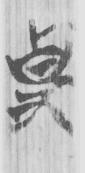史
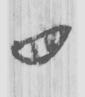四
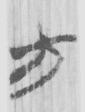方
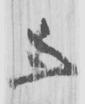之
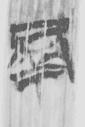羣
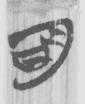明
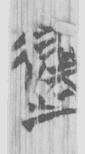歸
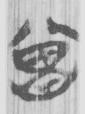曾
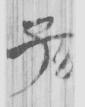孫
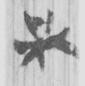某
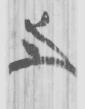之
